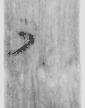九
